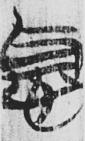怠（治）
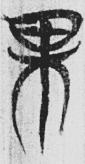果
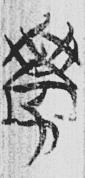○（勝）
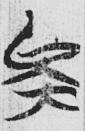矣
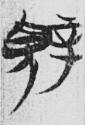親
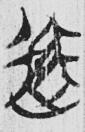○（率）
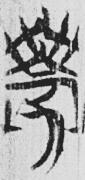○（勝）
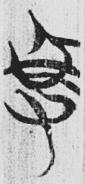史（使）
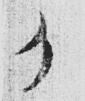人
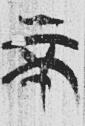不
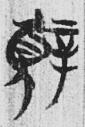親
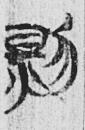則
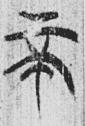不
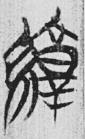○（敦）
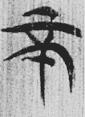不
